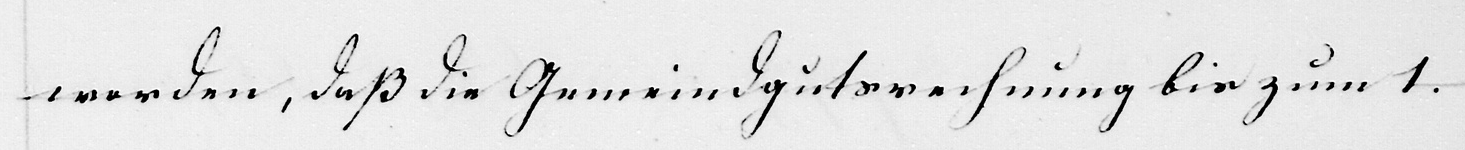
worden, daß die Gemeindgutsrechnung bis zum 1.
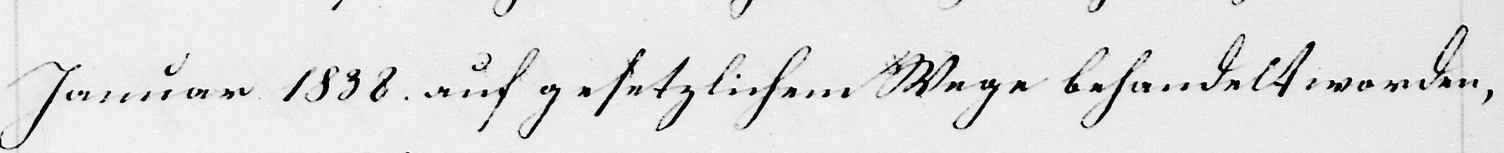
Januar 1838. auf gesetzlichem Wege behandelt worden,
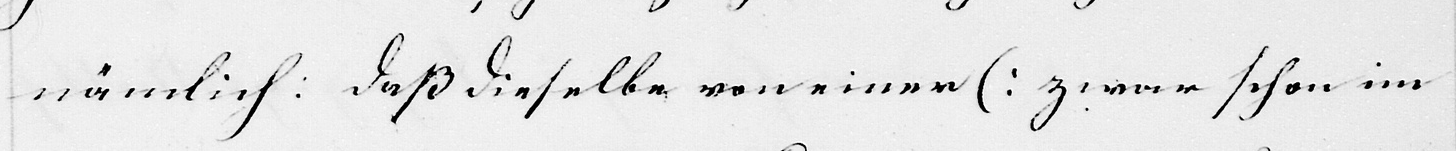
nämlich: daß dieselbe von einer [zwar schon im
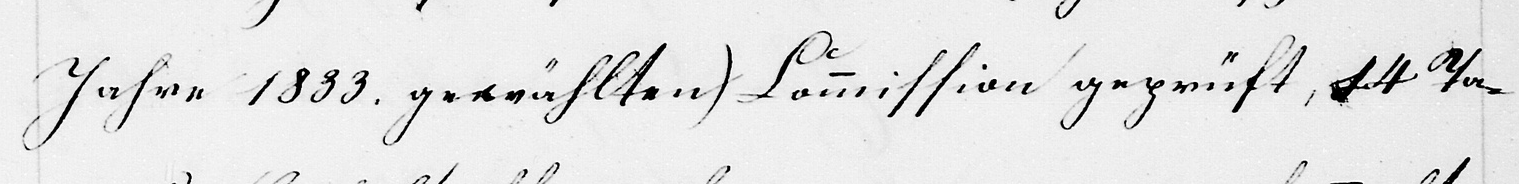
Jahre 1833. gewählten] Commission geprüft, 14 Ta¬
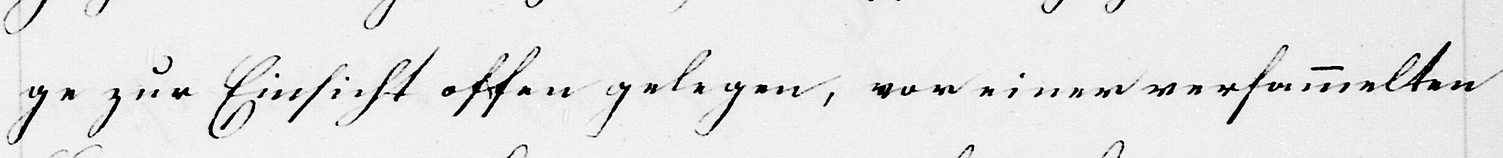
ge zur Einsicht offen gelegen, vor einer versammelten
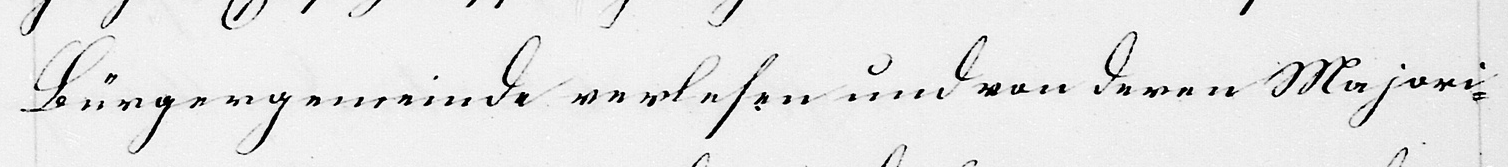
Bürgergemeinde verlesen und von deren Majori¬
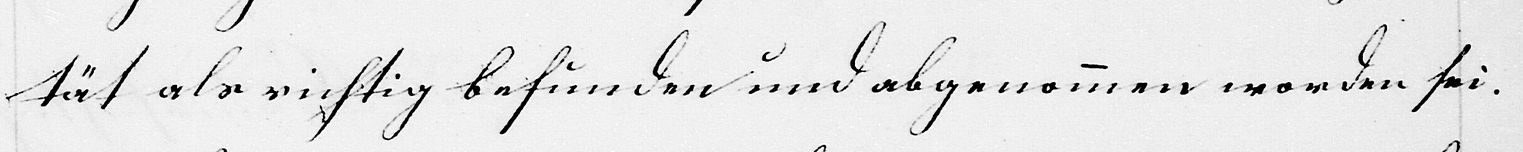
tät als richtig befunden und abgenommen worden sei.
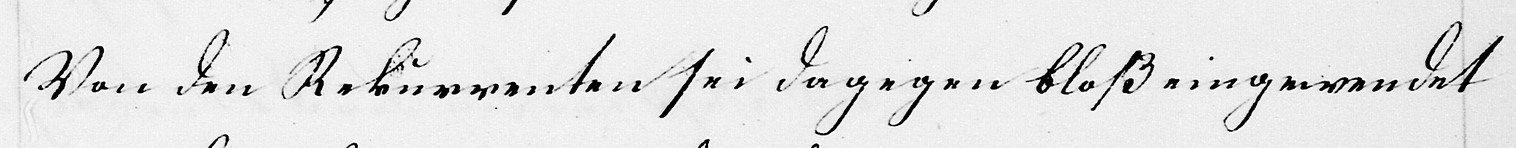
Von den Rekurrenten sei dagegen bloß eingewendet
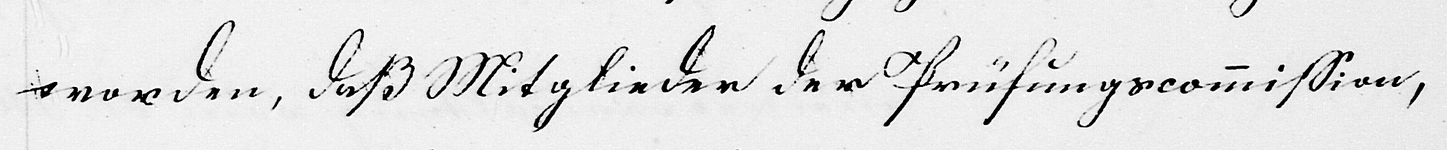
worden, daß Mitglieder der Prüfungscommißion,
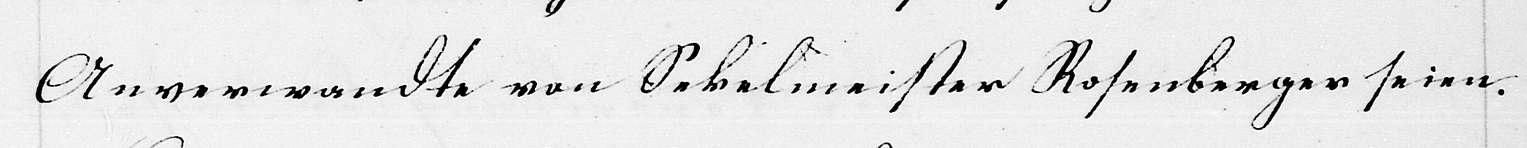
Anverwandte von Sekelmeister Rosenberger seien.
